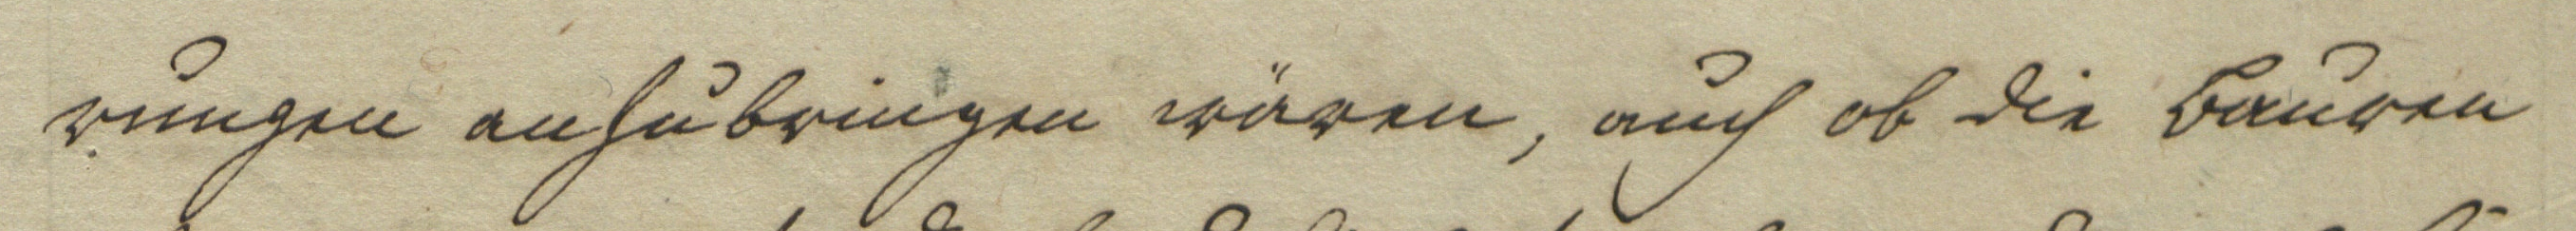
rungen anzubringen wären, auch ob die Bauren
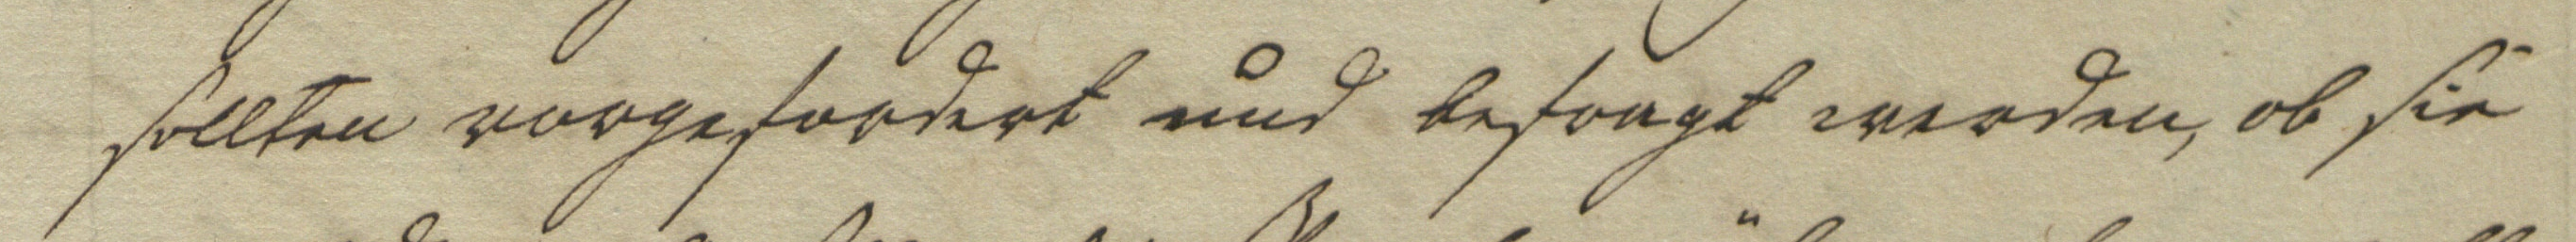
sollten vorgefordert und befragt werden, ob sie
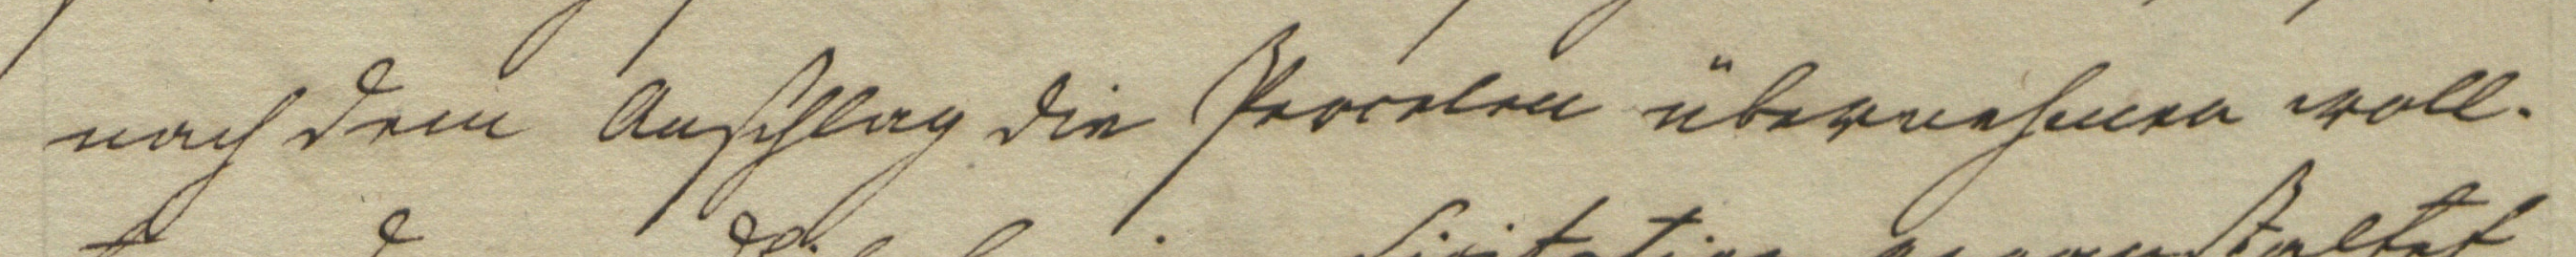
nach dem Anschlag die Percelen übernehmen woll¬
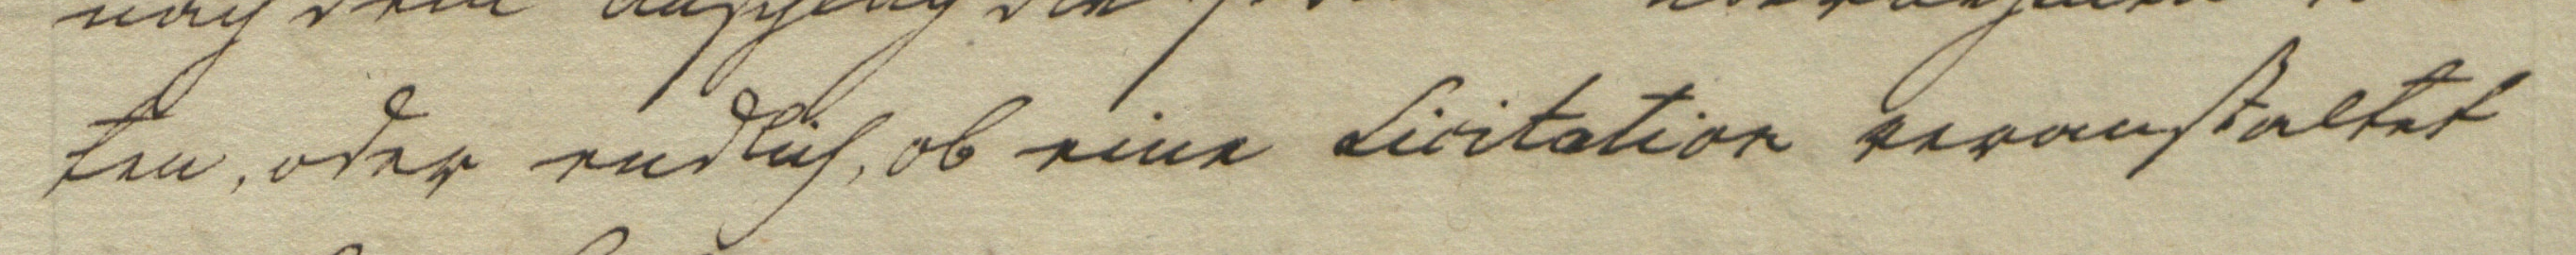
ten oder endlich, ob eine Licitation veranstaltet
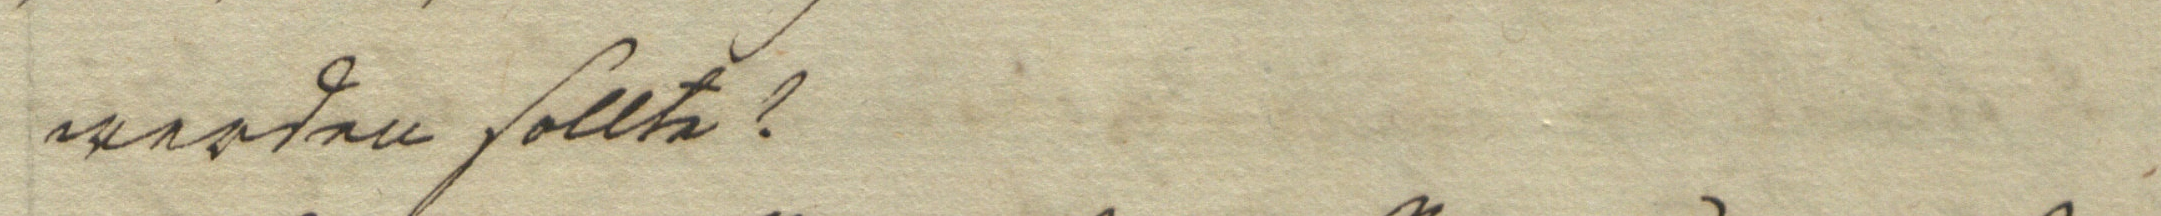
werden sollte?
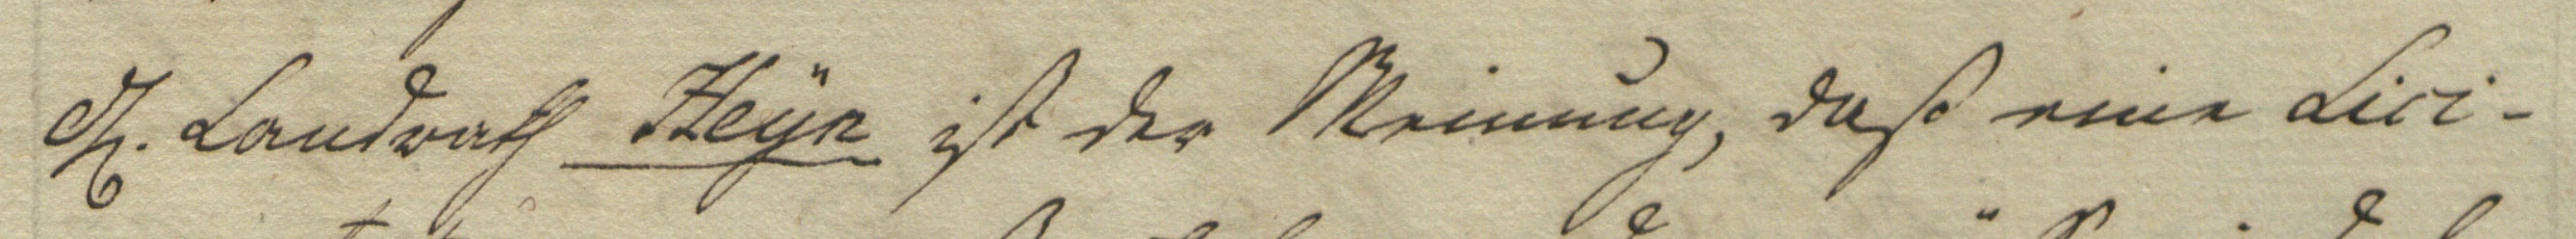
dh. Landrath Heyn ist der Meinung, daß eine Lici¬
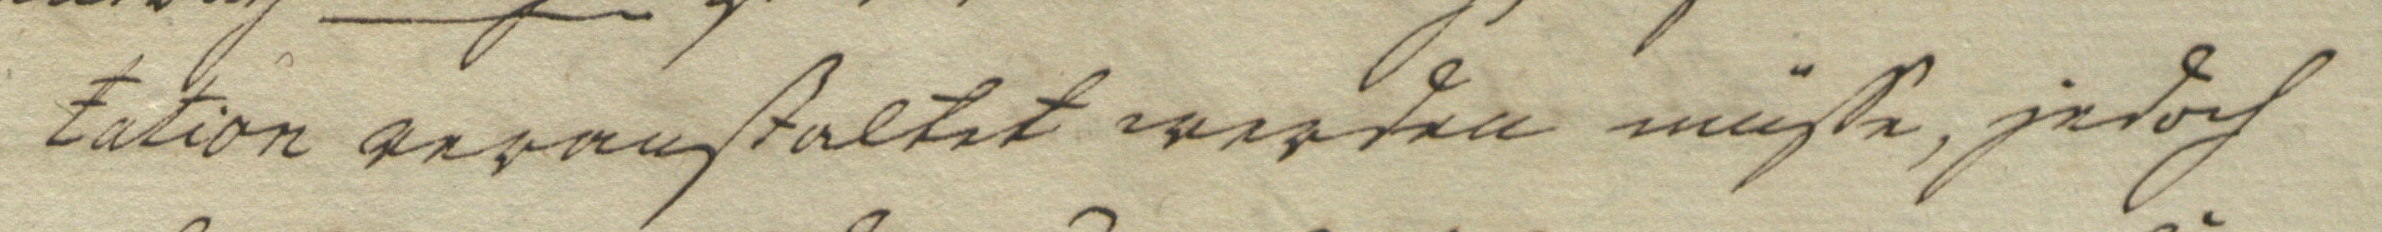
tation veranstaltet werden müsse, jedoch
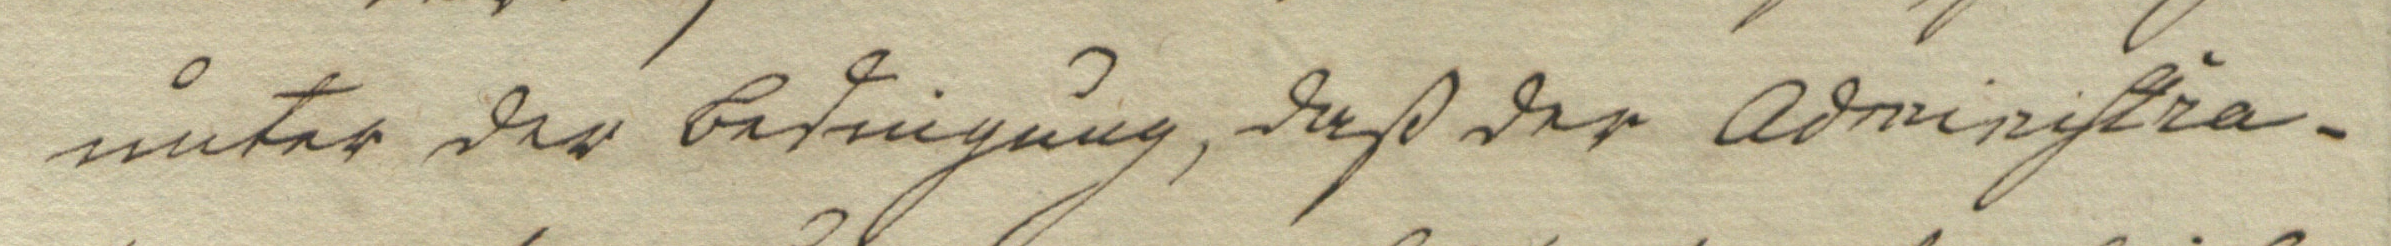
unter der Bedingung, daß der Adminstra¬
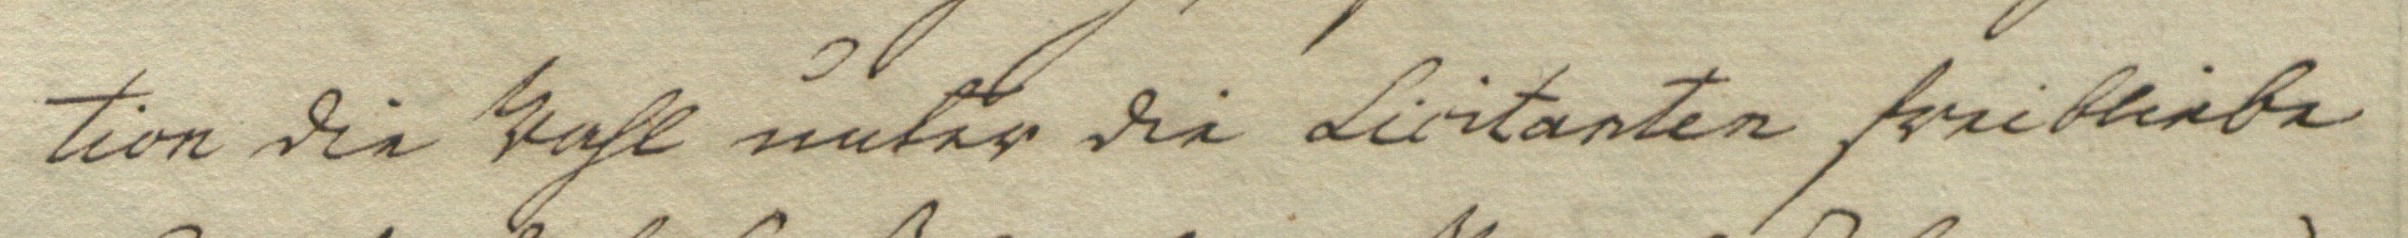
tion die Wahl unter die Licitanten freibliebe
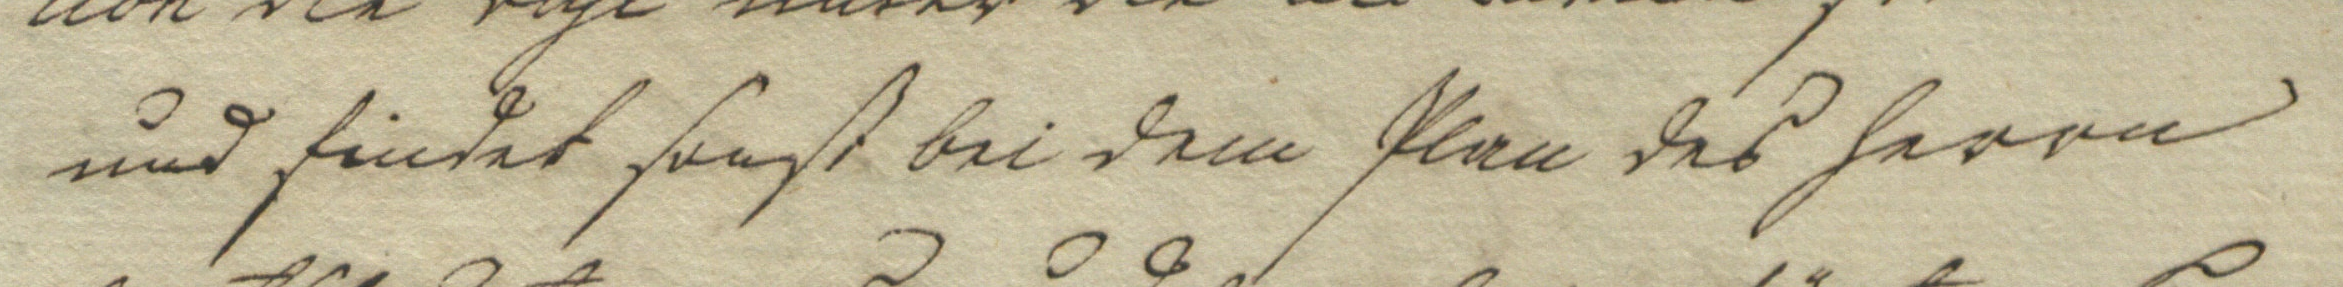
und findet sonst bei dem Plan des Herrn
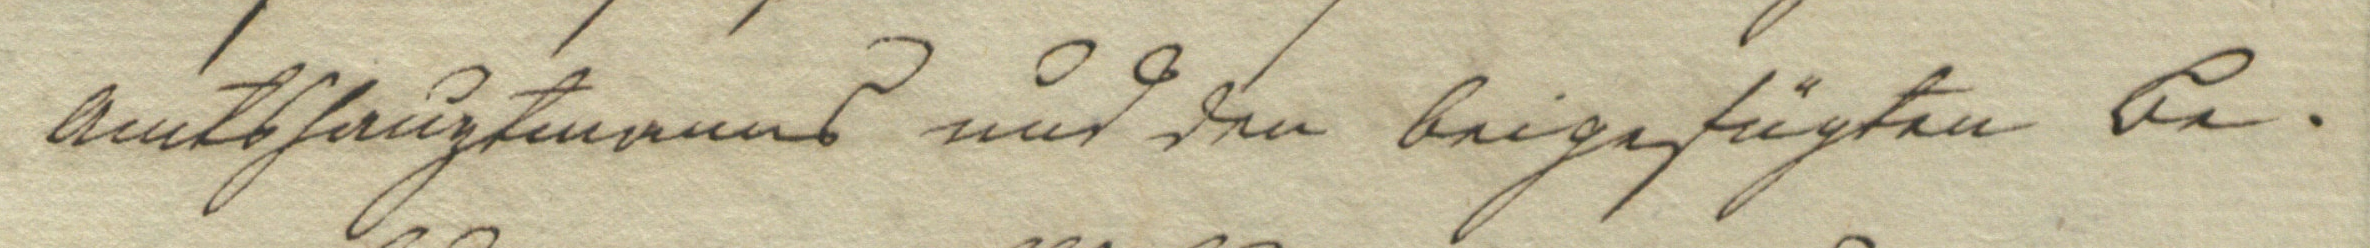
Amtshauptmanns und den beigefügten Be¬
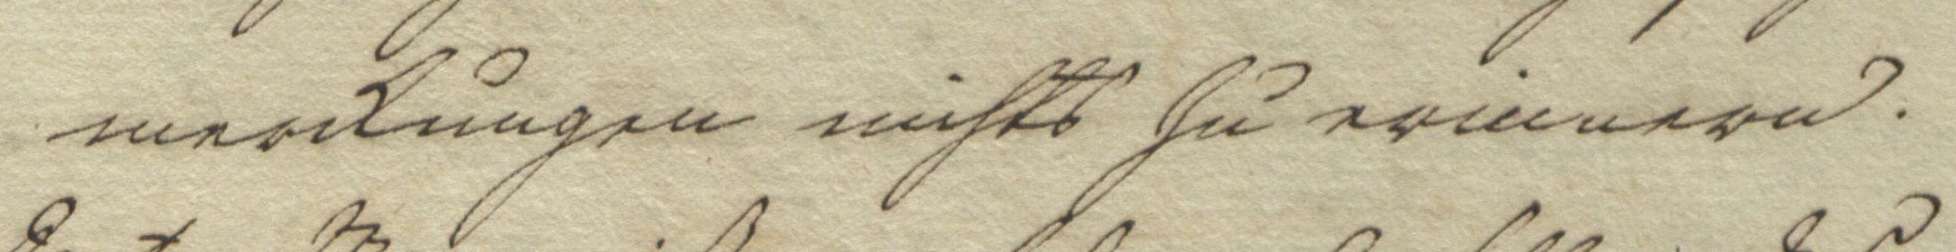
merkungen nichts zu erinnern.
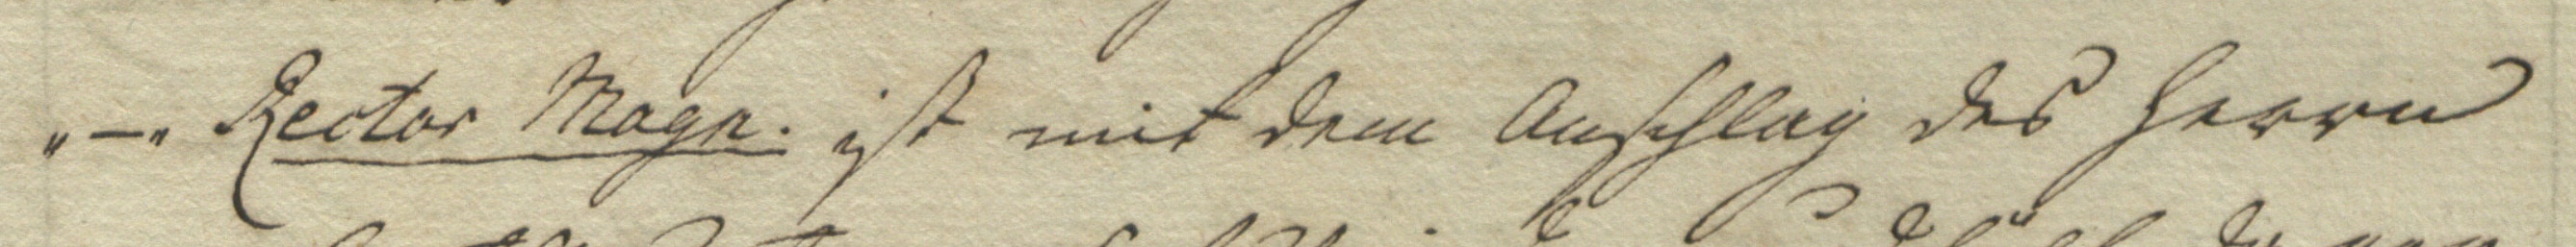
" - " Rector Magn. ist mit dem Anschlag des Herrn
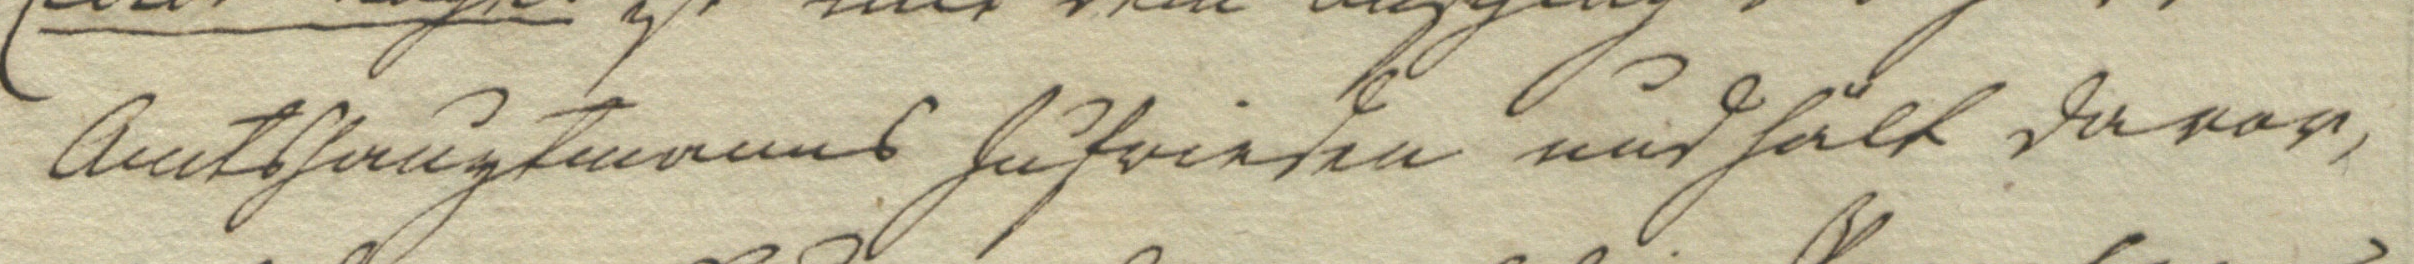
Amtshauptmanns zufrieden und hält davor,
